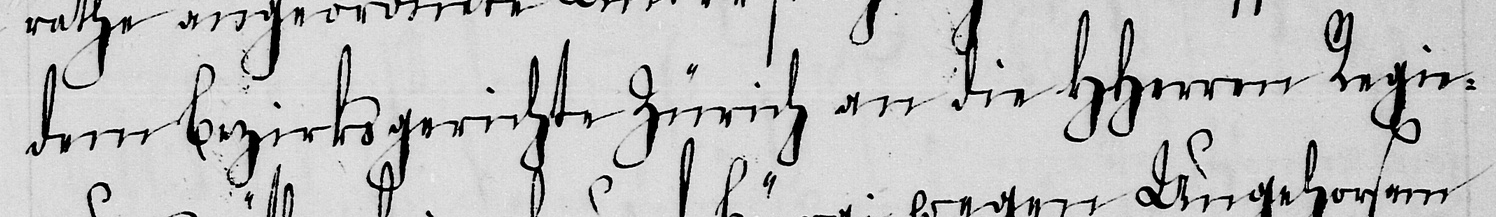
dem Bezirksgerichte Zürich an die HHerren Regie¬
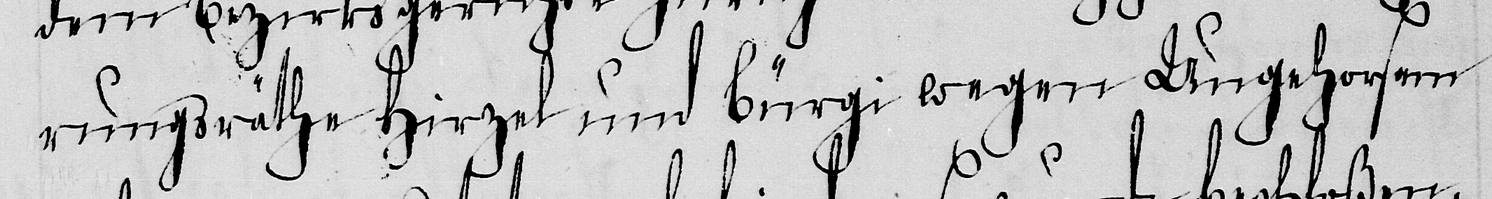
rungsräthe Hirzel und Bürgi wegen Ungehorsam
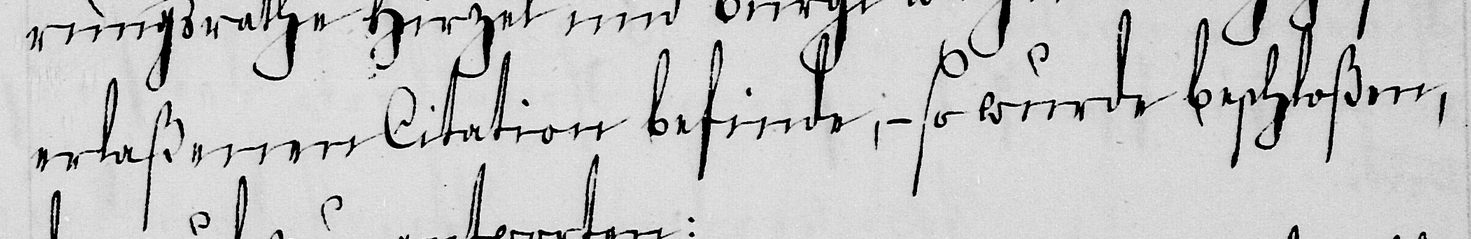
erlaßenen Citation befinde, – so wurde beschloßen,
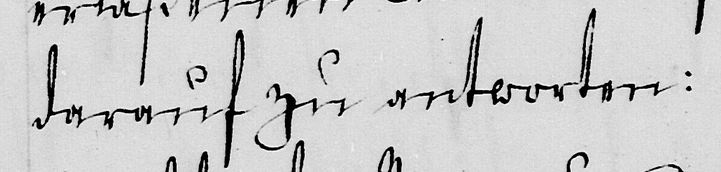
darauf zu antworten:
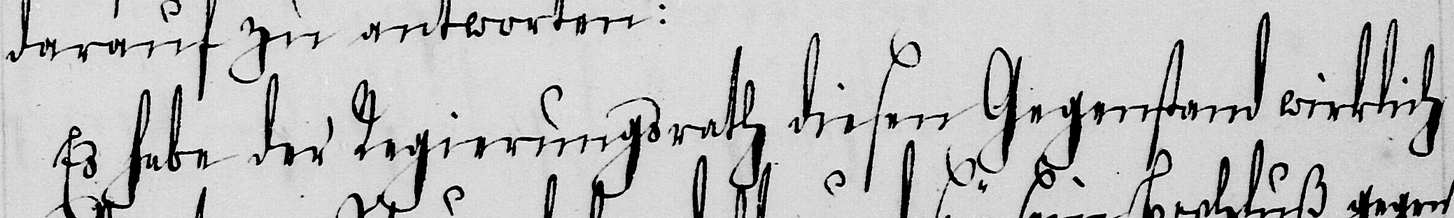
Es habe der Regierungsrath diesen Gegenstand wirklich
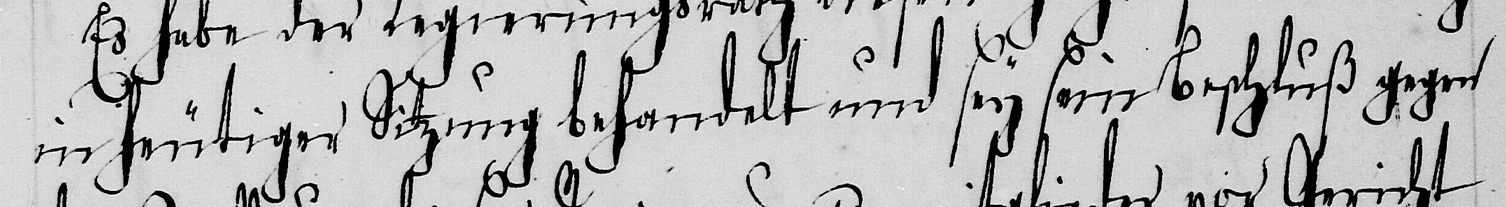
in heutiger Sitzung behandelt und sey sein Beschluß gegen
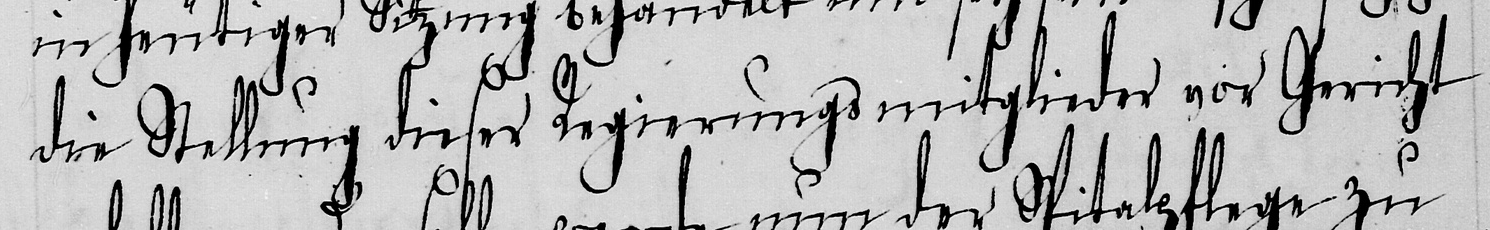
die Stellung dieser Regierungsmitglieder vor Gericht
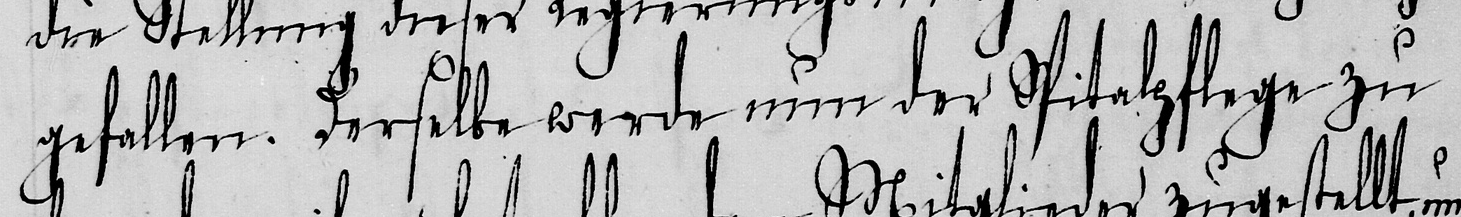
gefallen. Derselbe werde nun der Spitalpflege zu
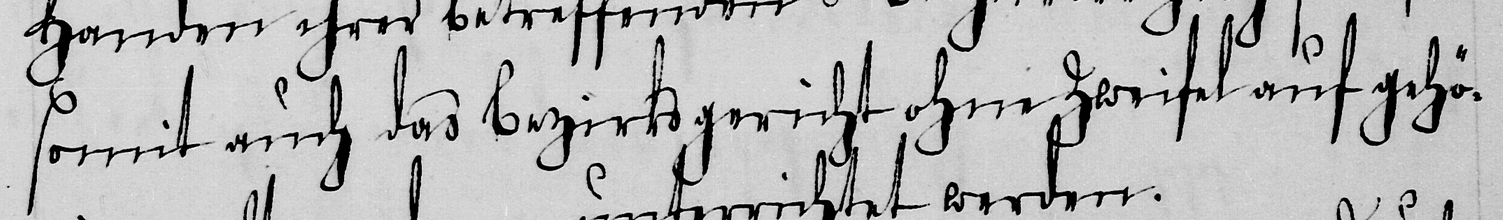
somit auch das Bezirksgericht ohne Zweifel auf gehö¬
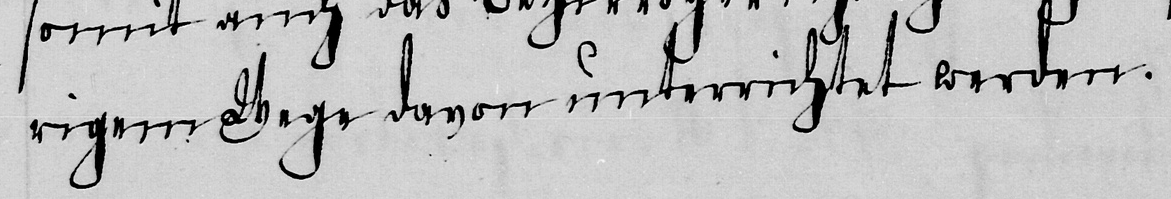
rigem Wege davon unterrichtet werden.
